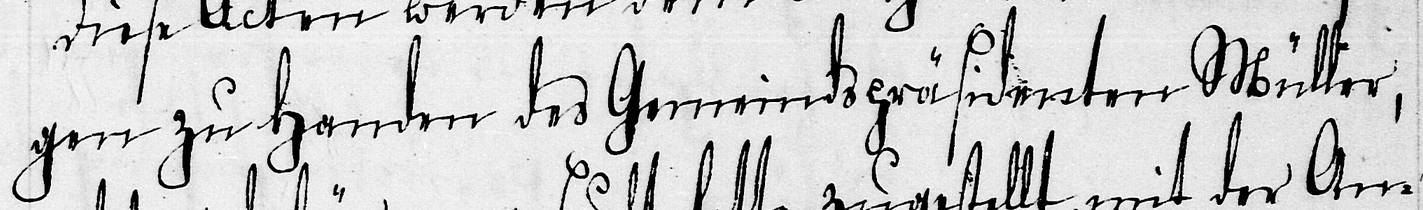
gen zu Handen des Gemeindspräsidenten Müller,
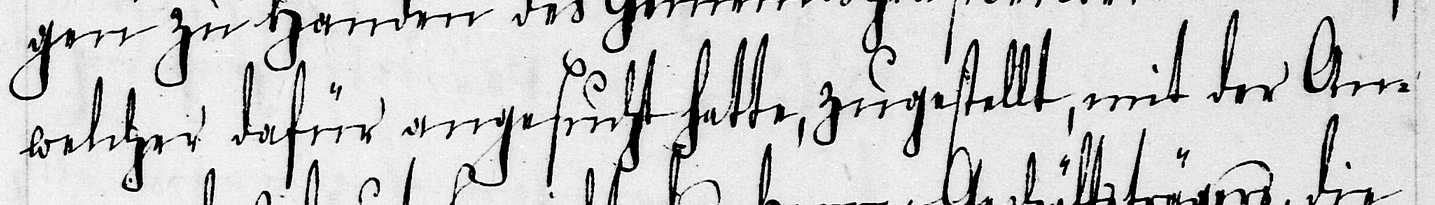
welcher dafür angesucht hatte, zugestellt, mit der An¬
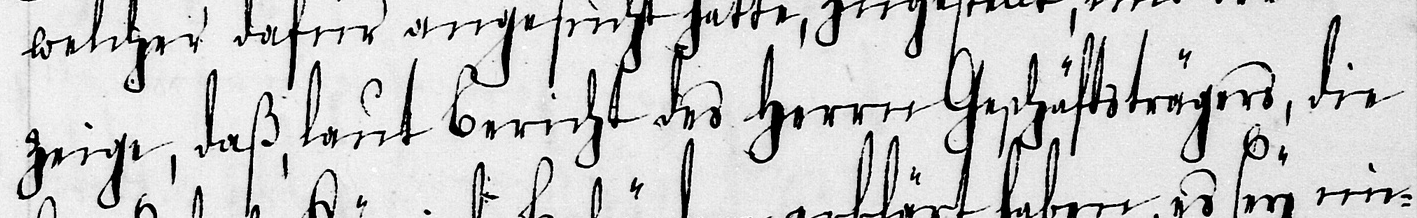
zeige, daß, laut Bericht des Herrn Geschäftsträgers, die
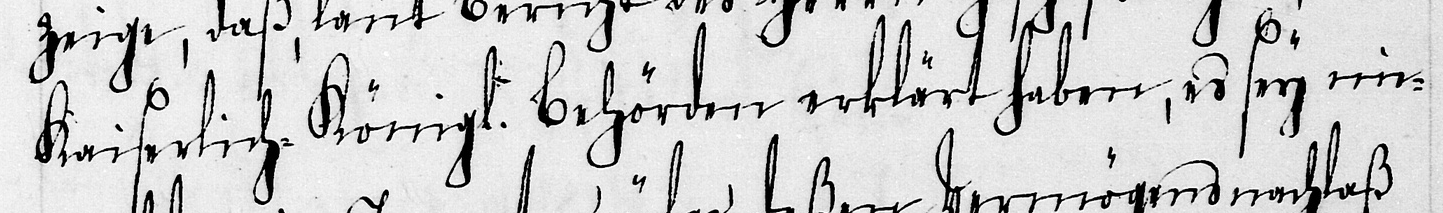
Kaiserlich-Königl. Behörden erklärt haben, es sey nie¬
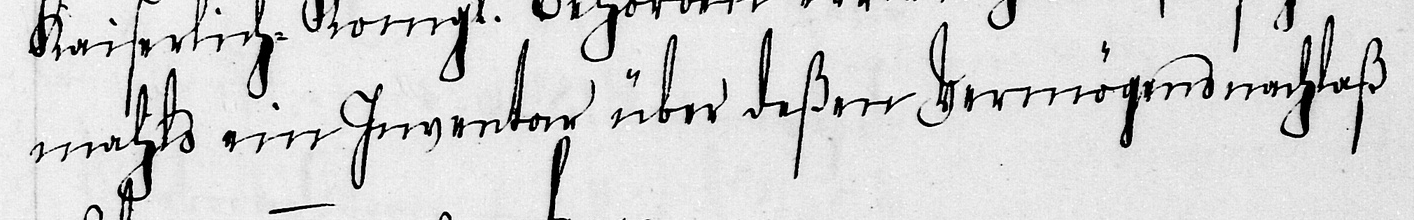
mahls ein Inventar über deßen Vermögensnachlaß
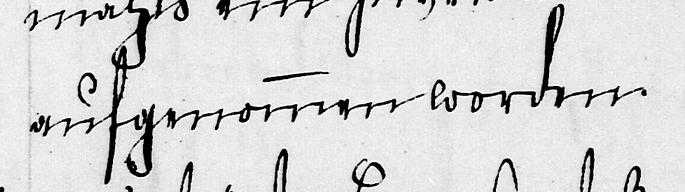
aufgenommen worden.
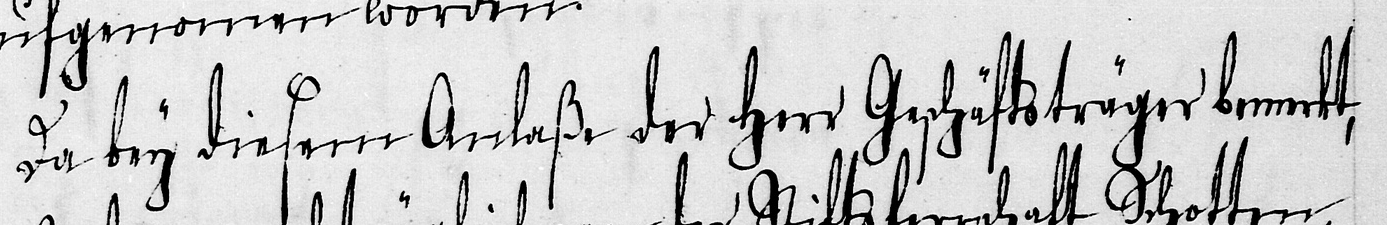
Da bey diesem Anlaße der Herr Geschäftsträger bemerk¬
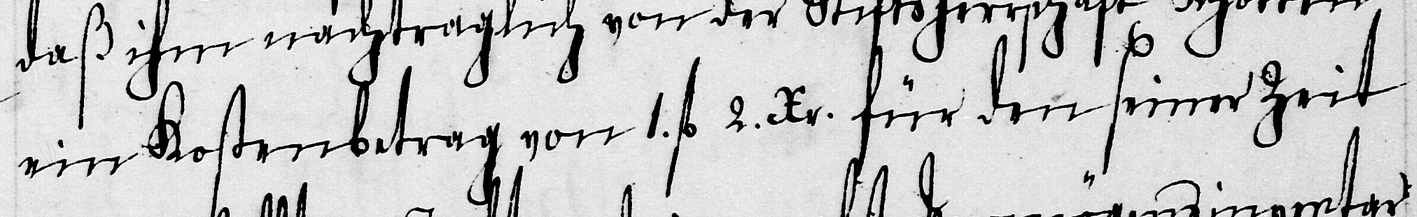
ein Kostenbetrag von 1. fl. 2. Xr. für den seiner Zeit
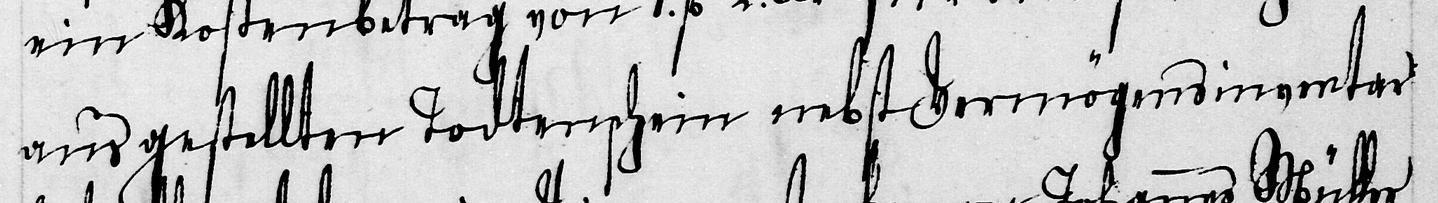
ausgestellten Todtenschein nebst Vermögensinventar
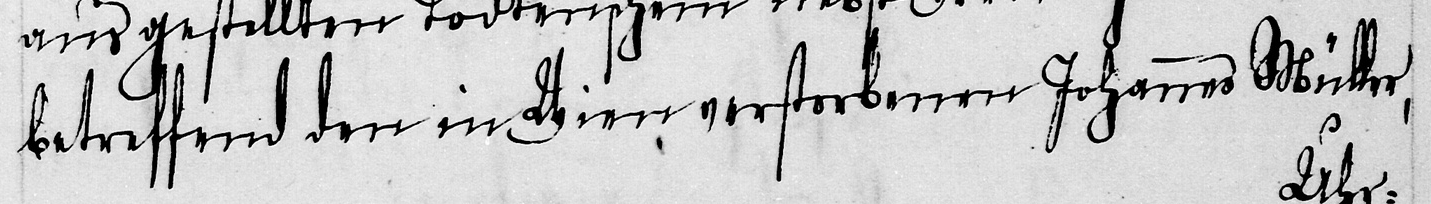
betreffend den in Wien verstorbenen Johannes Müller,
